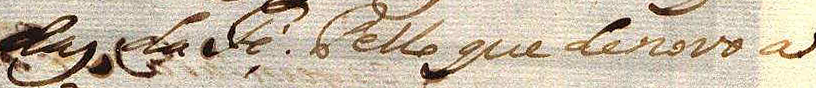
das da Fé; Pello que de novo a
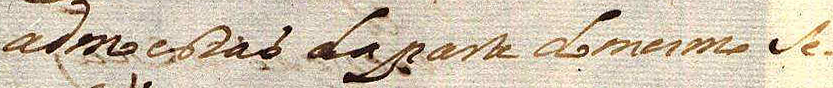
admoestaõ da parte do mesmo se
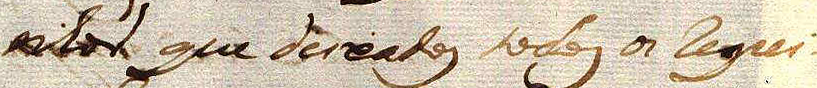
nhor que deixados todos os Respei
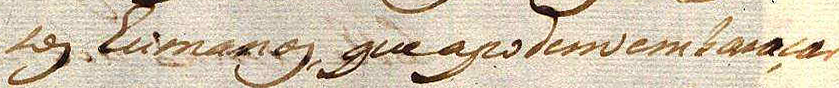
tos humanos, que a podem embaraçar
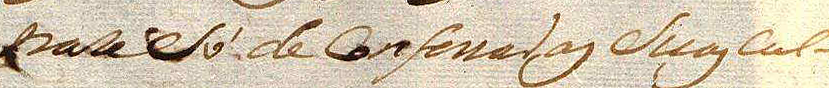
trate só de confessar as suas cul
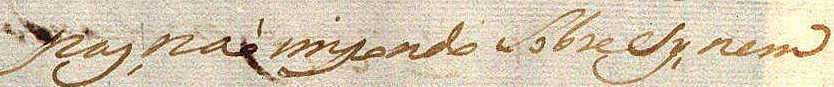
pas, naõ impondo sobre sy, nem
